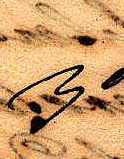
3o.
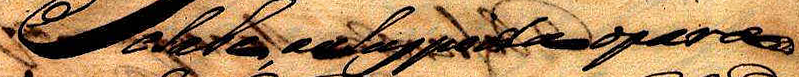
Se sabe, ou Suspeita o para
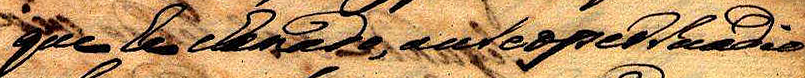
que he chamado, ou se o persuadio
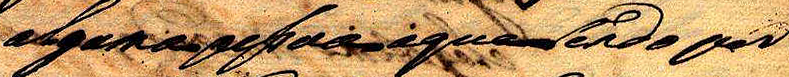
aLguma pessoa a que sendo per
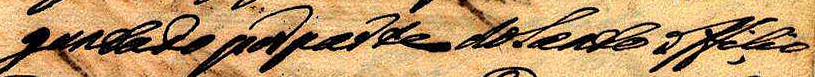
guntado por parte do Santo offiÇio
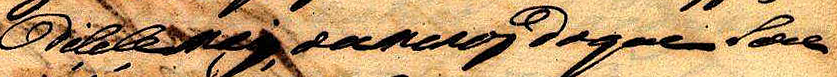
diÇeÇe mais, ou menos do que sou
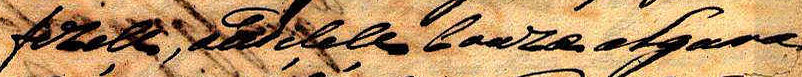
fiZeÇe, ou diÇeÇe Couza aLguma
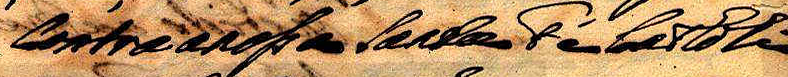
Contra a nossa santa Fé CathoLi
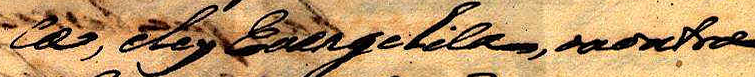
ca, e Ley EvangeLica, ou outra
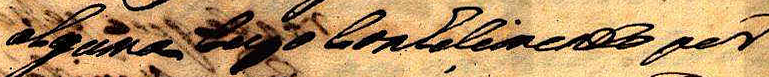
aLguma Cujo ConheÇimento per
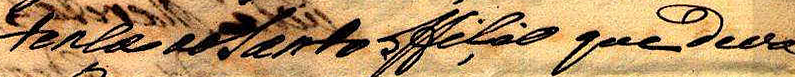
tenÇa ao Santo offiÇio que deva
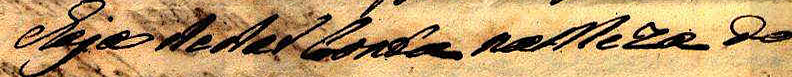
e haja de dar Conta na Meza do
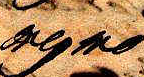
mesmo
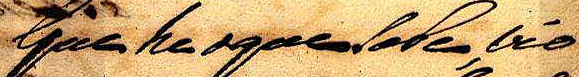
Que he o que sabe, vío
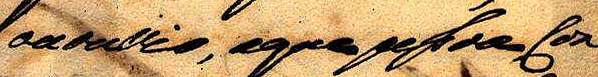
ou ouvio, a que pessoa Con
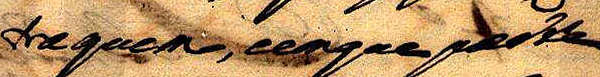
tra quem, e em que parte
